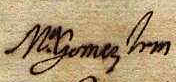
M.a Gomez Irm
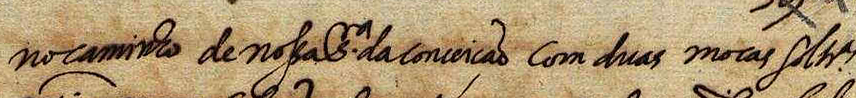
no caminho de nossa s.ra da conceição com duas moças soltr.as
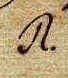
R.
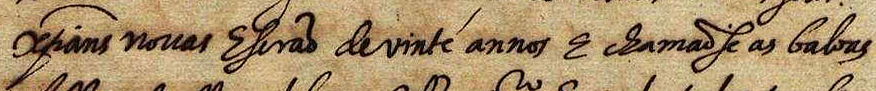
xpāns nouas E serão de vinte annos E chamaõse as baloas
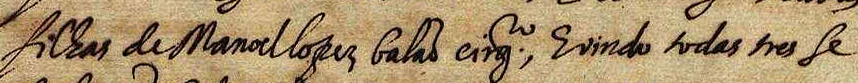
filhas de Manoel lopez balaõ cirg.ro, E vindo todas tres se
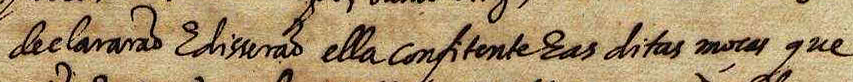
declararaõ E disseraõ ella confitente E as ditas moças que
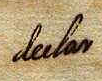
declar
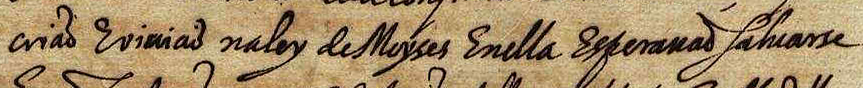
criaõ E viuiaõ na ley de Moyses E nella Esperauaõ saluarse
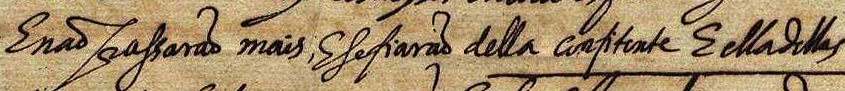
E naõ passarão mais, E se fiarão della confitente E ella dellas
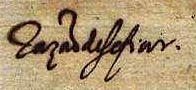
Razaõ de se fiar.
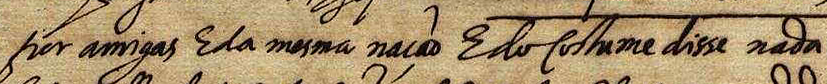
por amigas E da mesma nação E do Costume disse nada.
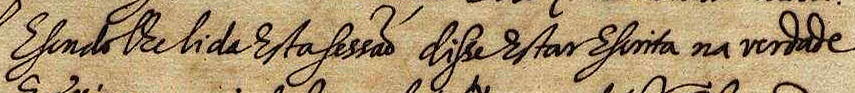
E sendolhe lida Esta sessão disse Estar Escrita na verdade
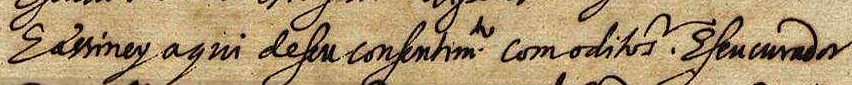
E assiney aqui de seu consentim.to com o dito sr. E seu curador
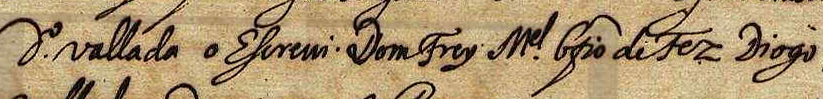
D.o vallada o Escreui. Dom Frey M.el bpō de Fez Diogo
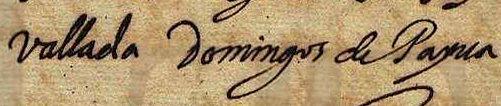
vallada Domingos de Payua
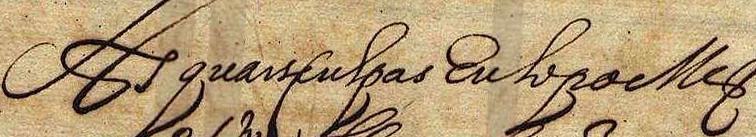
As quais Culpas Eu lopo Mis̄
